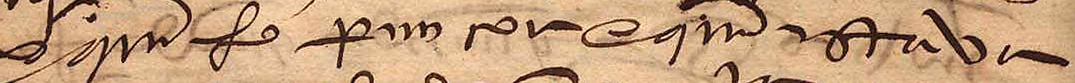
e quē ho pemsou e quē estava
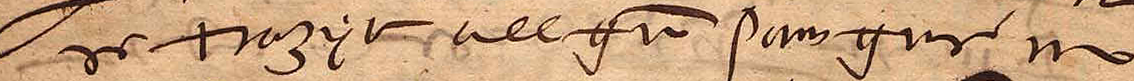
se trazya allgū samgue no
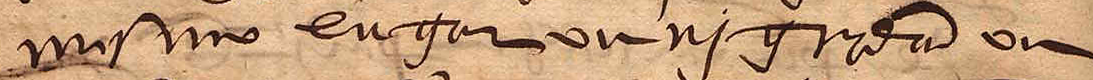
mesmo lugar ou njgrydā ou
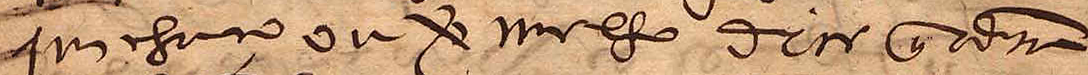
Jmchaço ou ꝟmelho dyse q̄ a dita
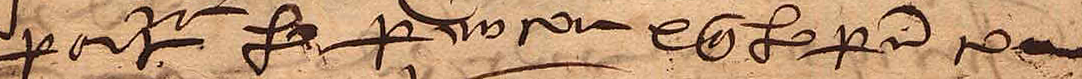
partra ho pemsou e q̄ ho pēso
